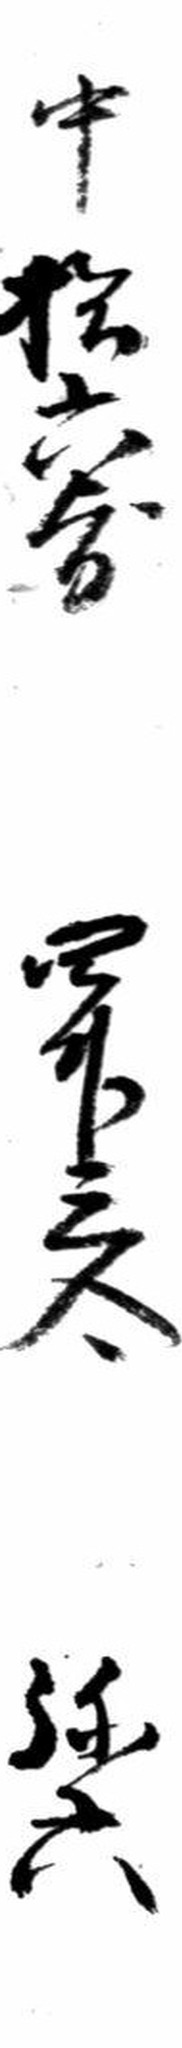中拾六歩四升三合弥六
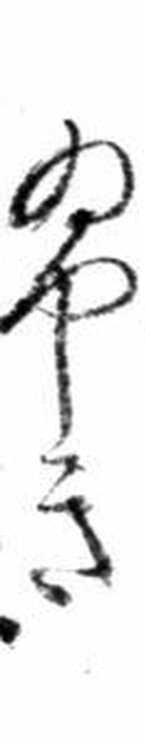ゐやしき
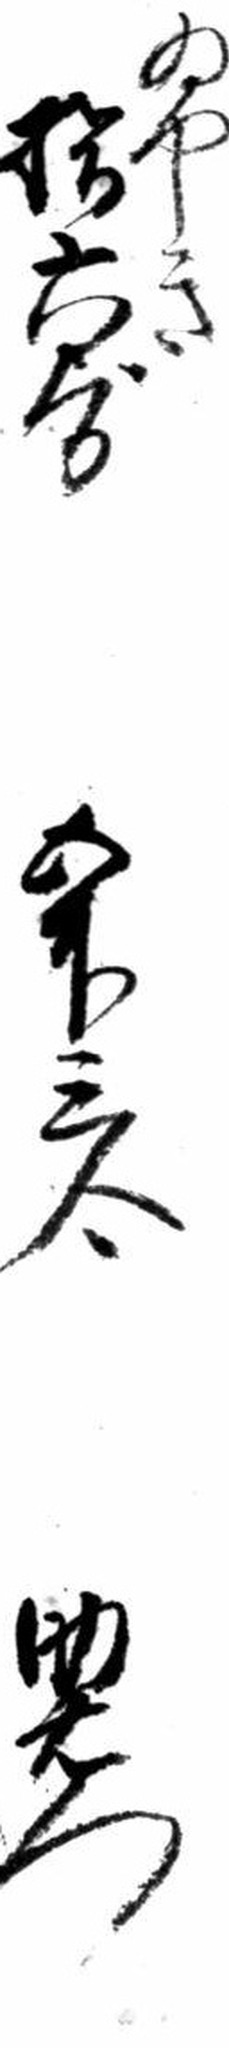拾六歩五升三合助右衛門
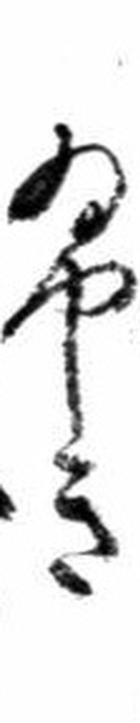ゐやしき
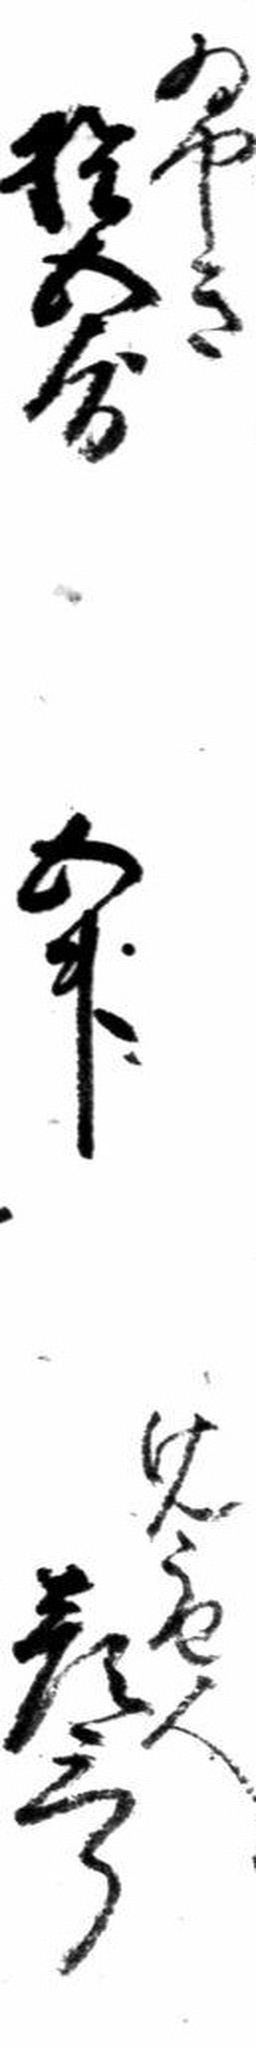拾五歩五升彦三郎
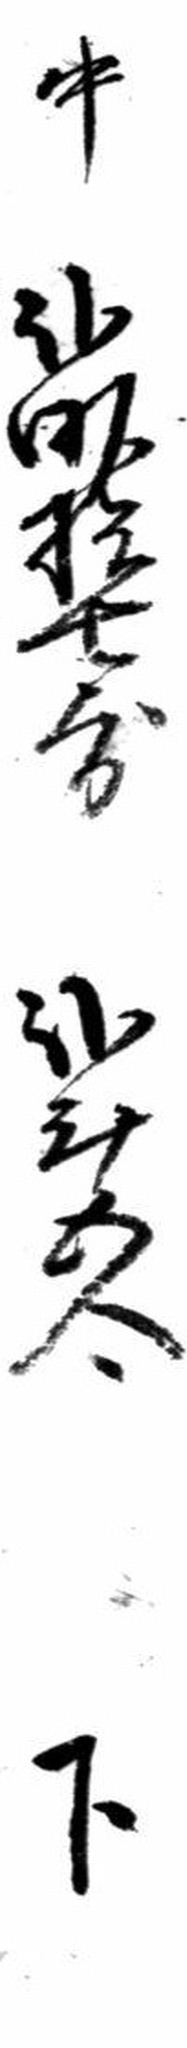中弐畝拾七歩弐斗五合下
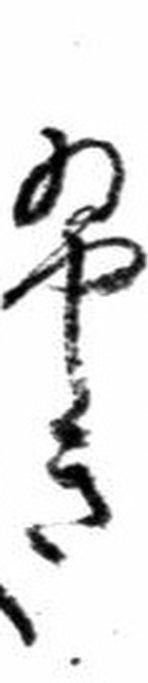ゐやしき

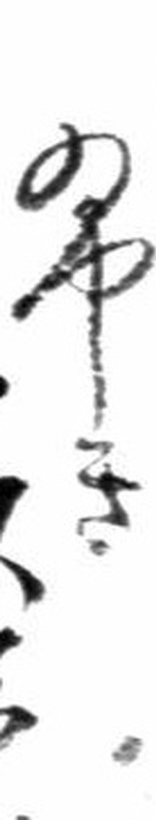ゐやしき
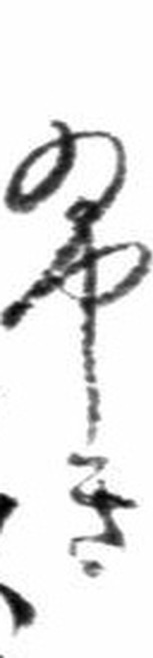ゐやしき
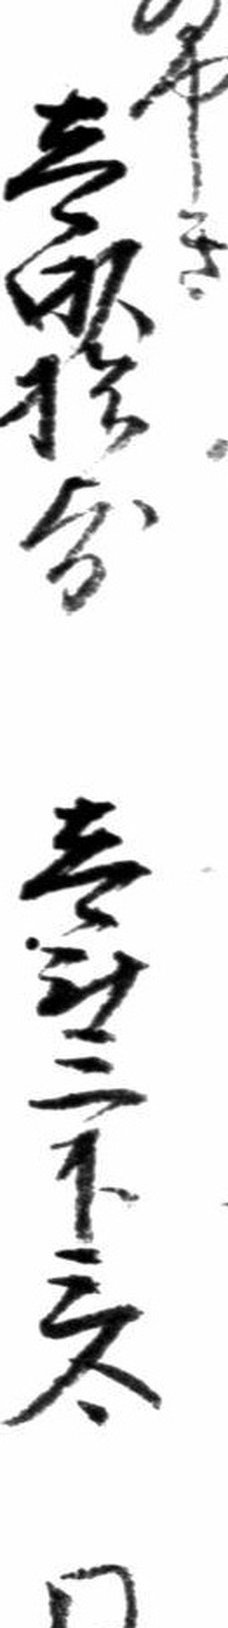壱畝拾歩壱斗三升三合同人
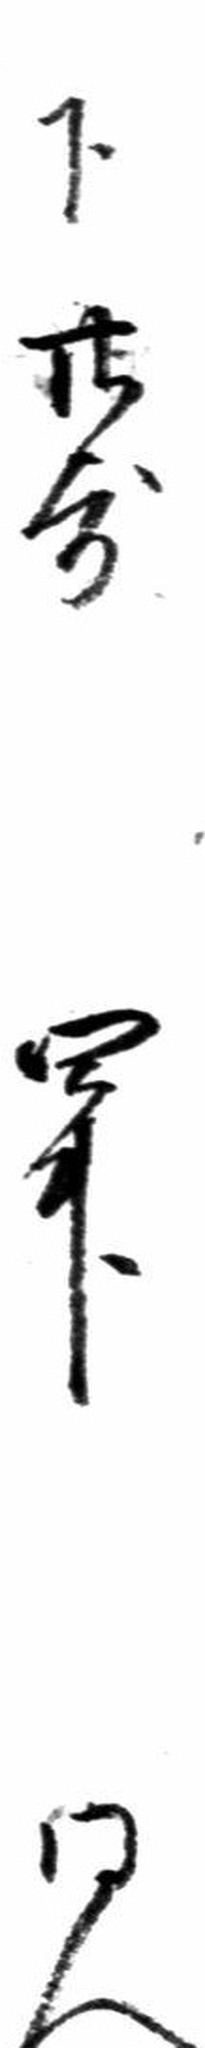下廿歩四升同人
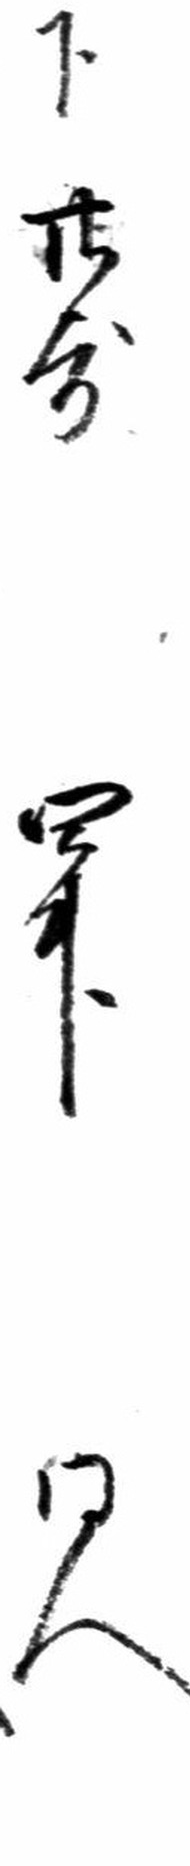下廿歩四升同人
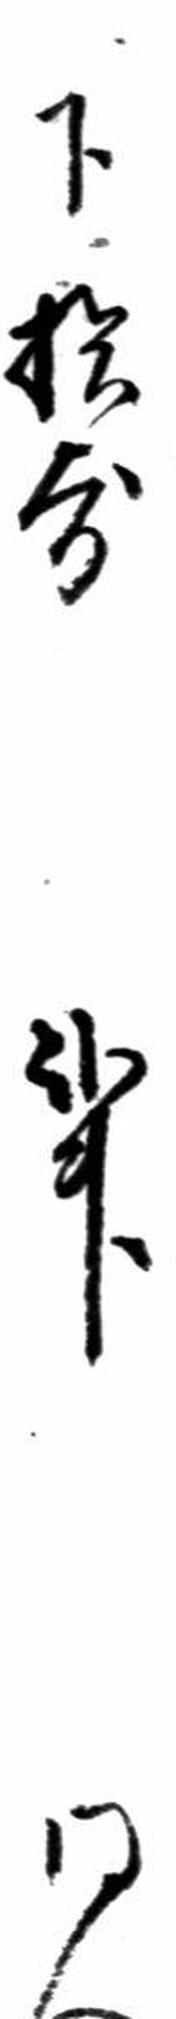下拾歩弐升同人
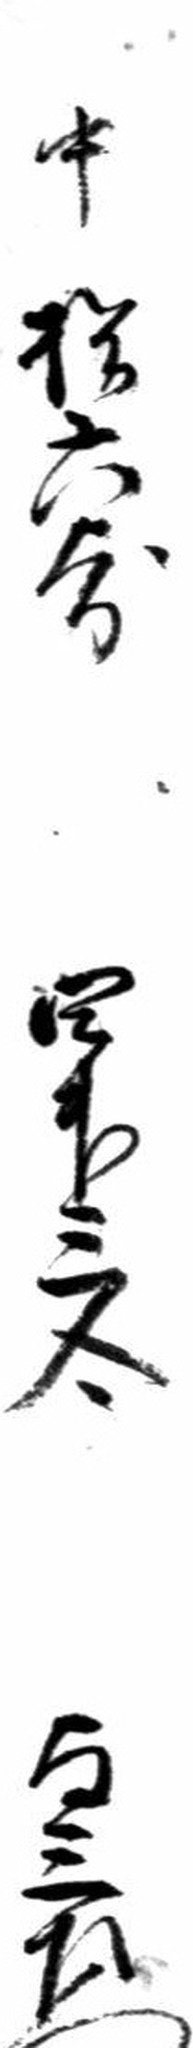中拾六歩四升三合彦九郎
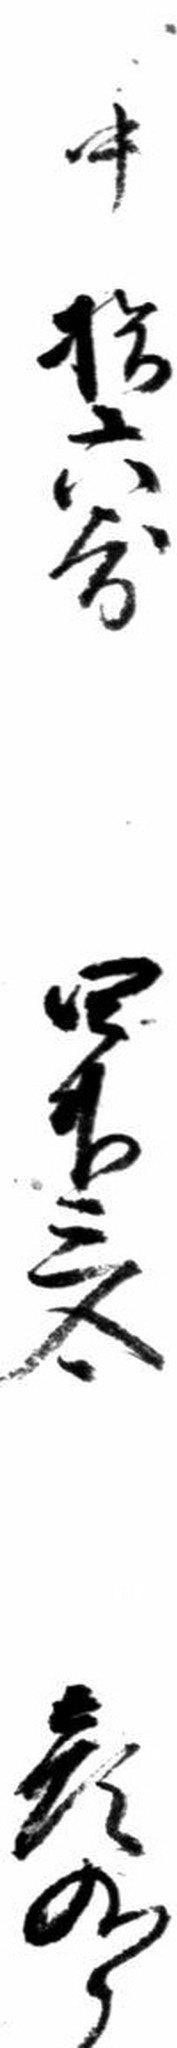中拾六歩四升三合彦九郎
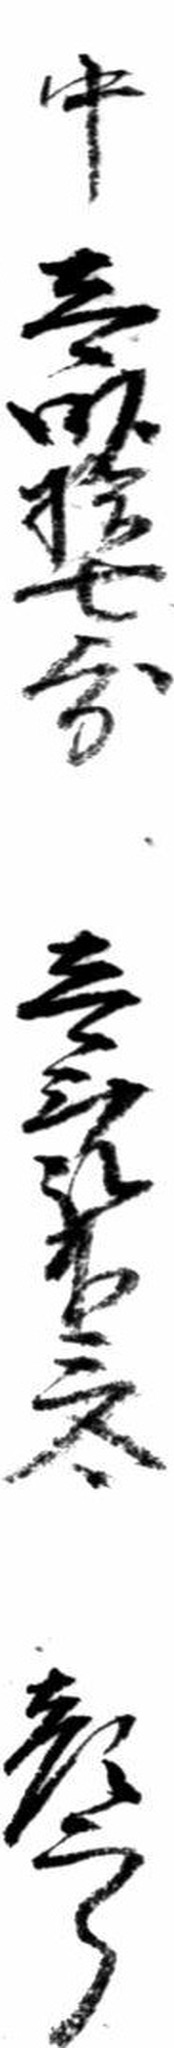中壱畝拾七歩壱斗弐升三合彦二郎
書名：若州三方郡之内世久見浦御検地帳（世久見浦検地帳写）
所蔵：福井県文書館 Fukui Prefectural Archives
